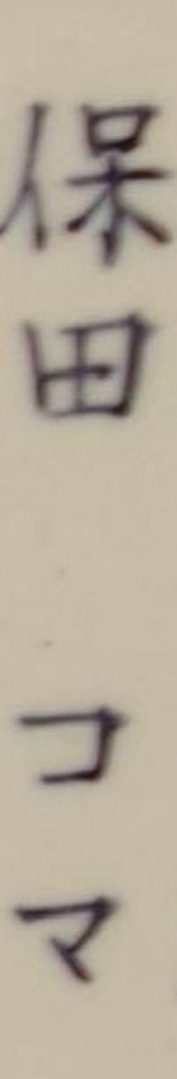保田コマ
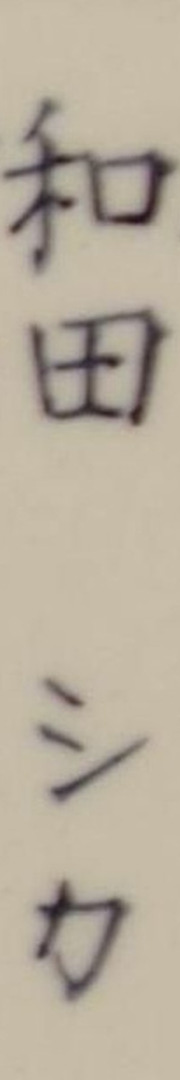和田シカ
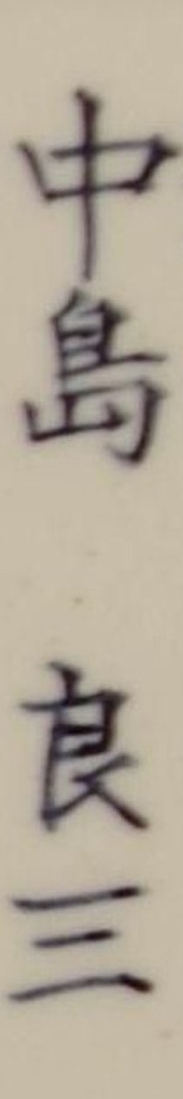中島良三
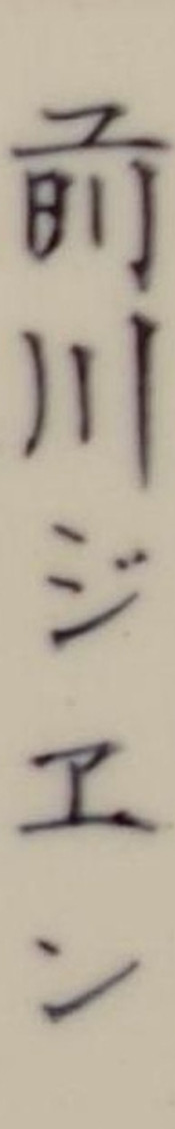前川ジヱン
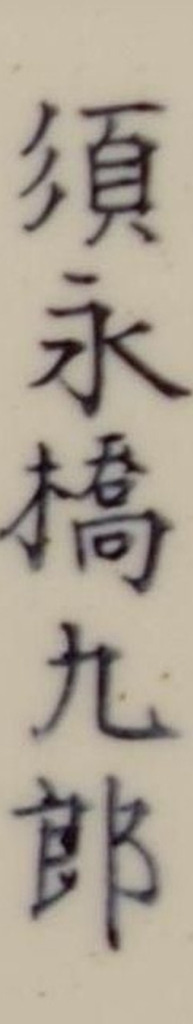須永橘九郎
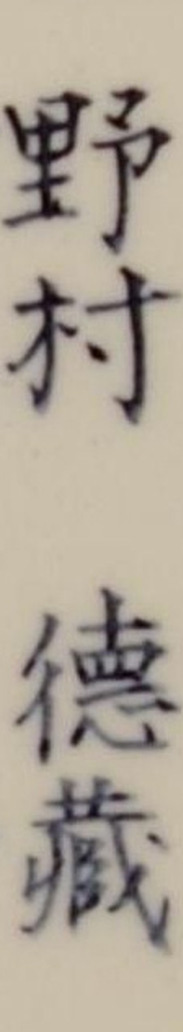野村徳蔵
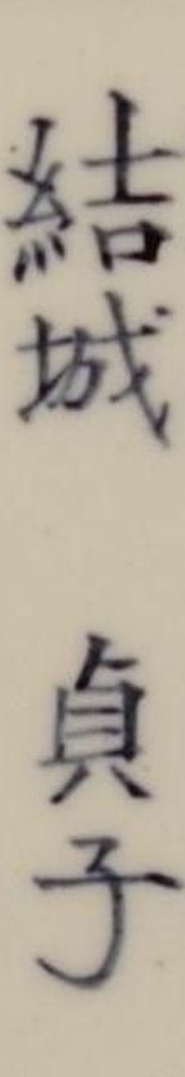結城貞子
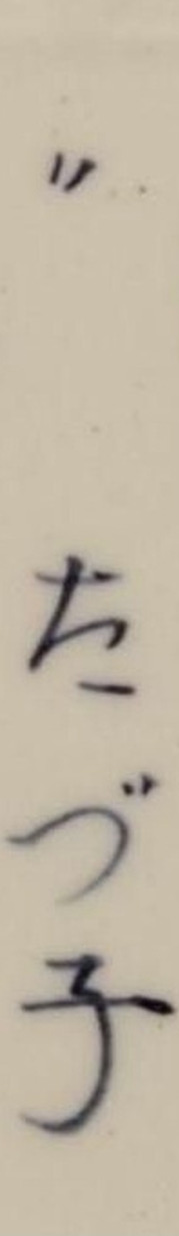たづ子
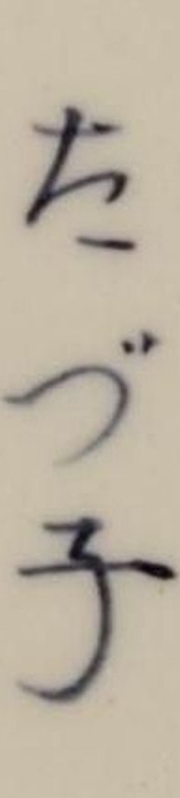たづ子
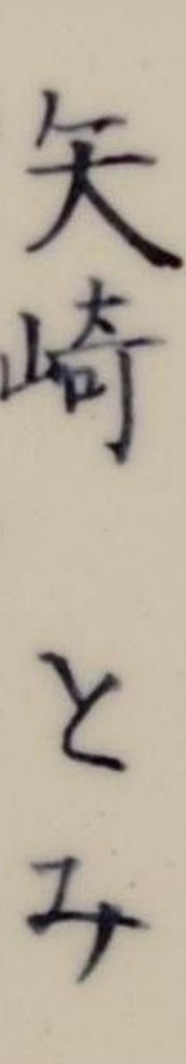矢崎とみ
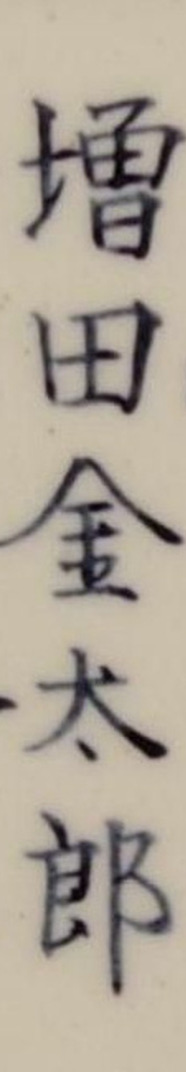増田金太郎
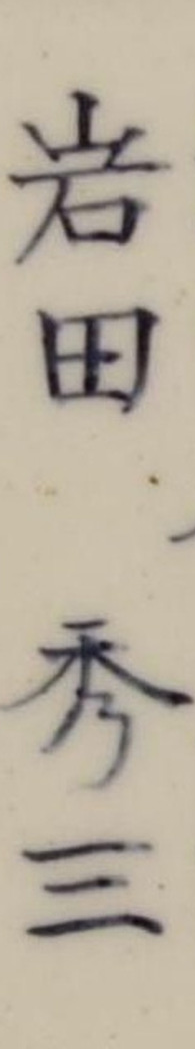岩田秀三
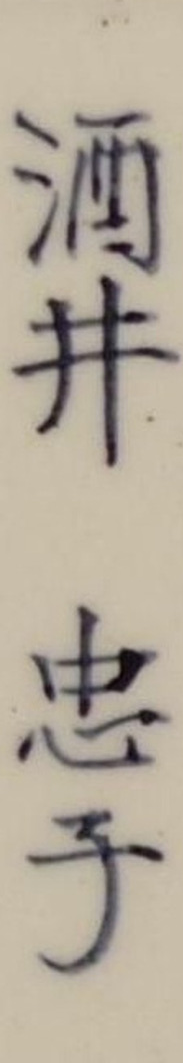酒井忠子
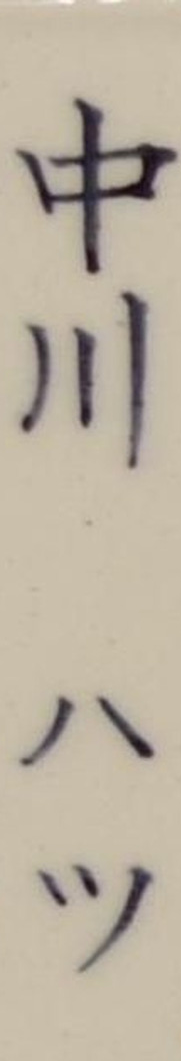中川ハツ
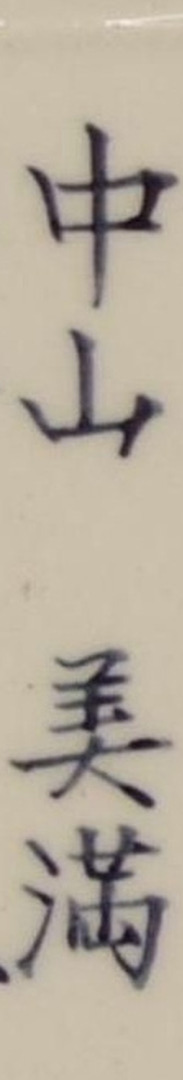中山美満
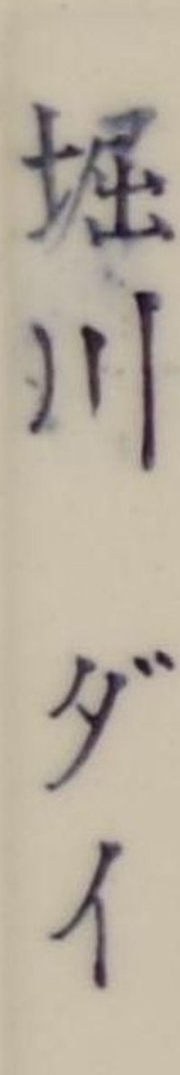堀川ダイ
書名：M~S
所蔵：高野山金剛峯寺
